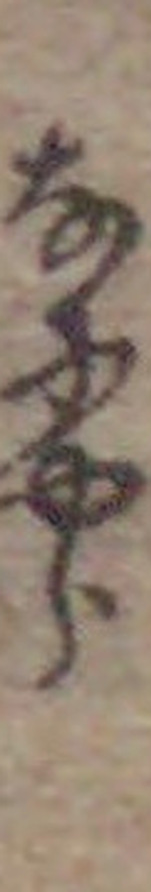なにやら
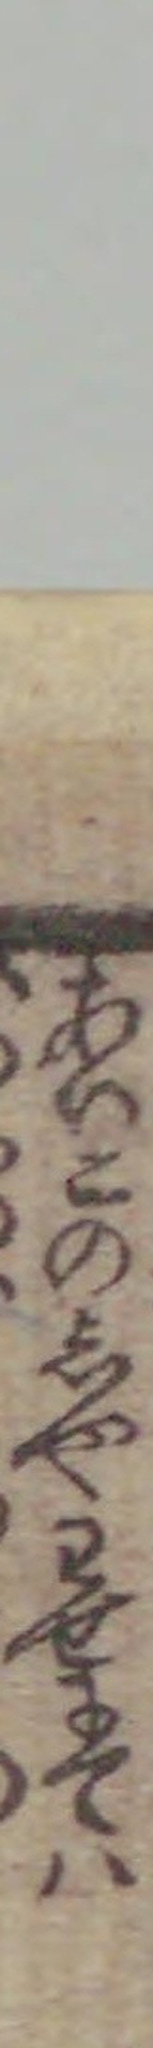あいこのしやわせにては
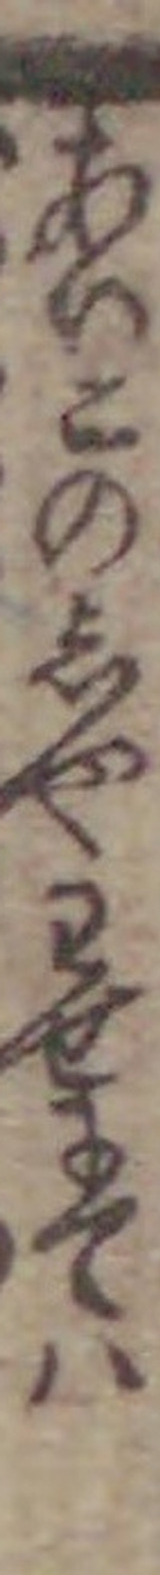あいこのしやわせにては
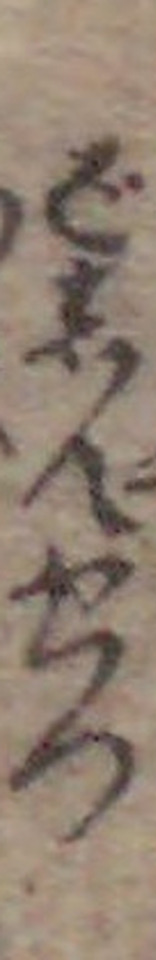ごしんせつ
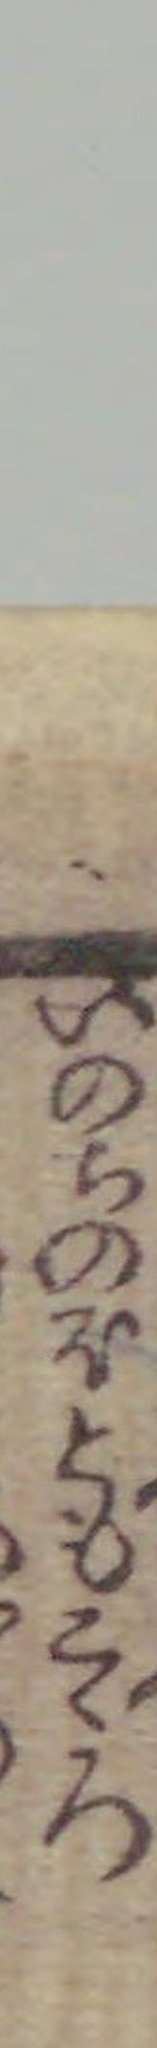いのちのほともこゝろ
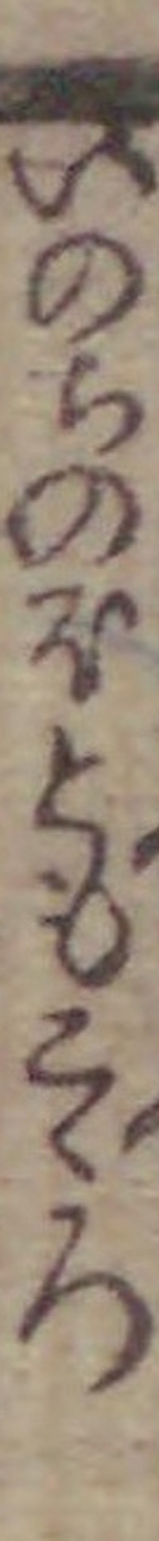いのちのほともこゝろ
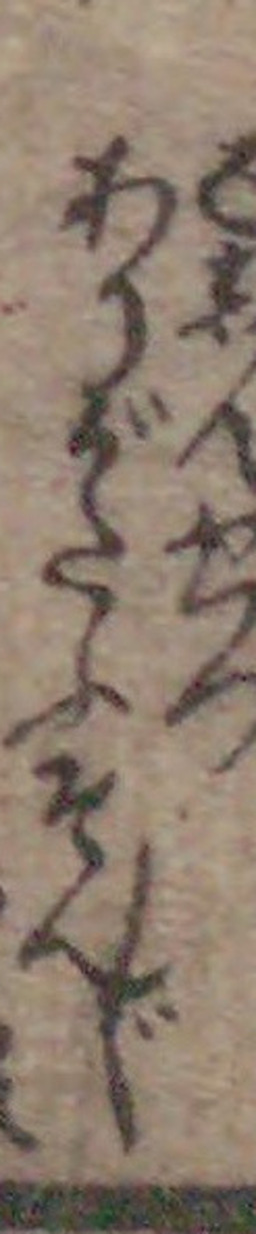ありがたふそんじ
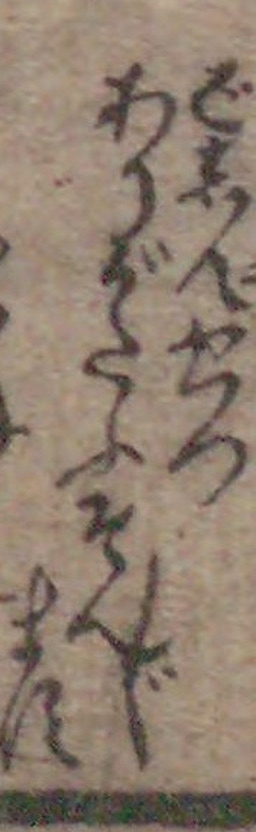ありがたふそんじ
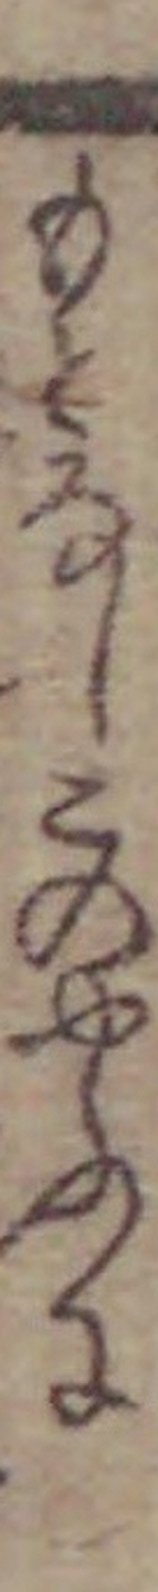もとなしこのやふに
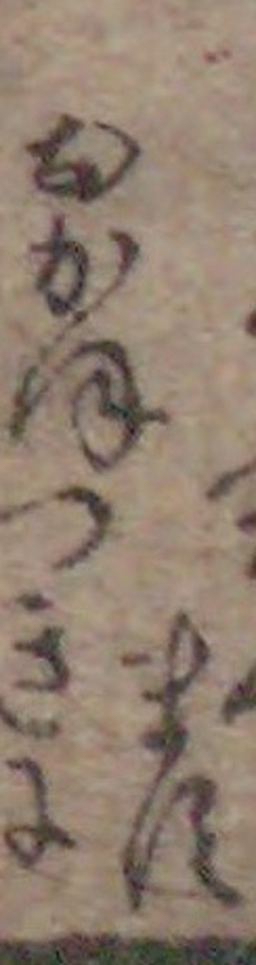おかほつきに
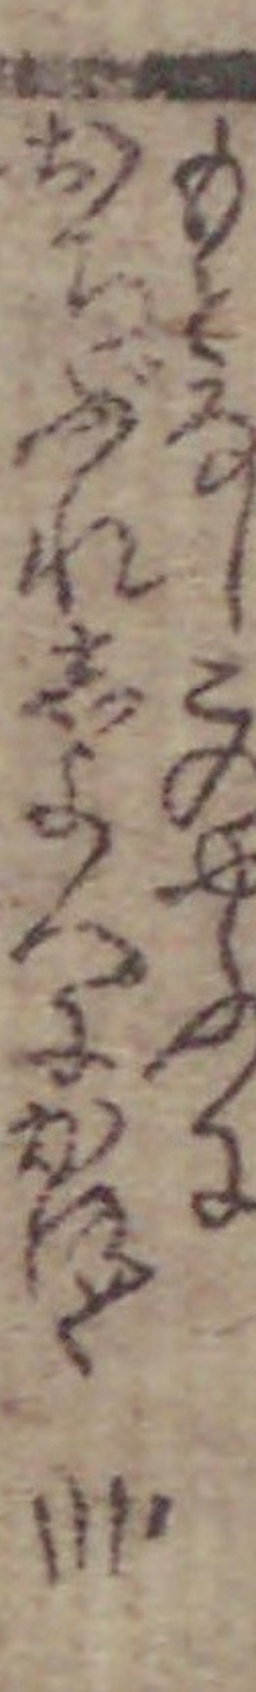おちぶれしよ人にかほゝ
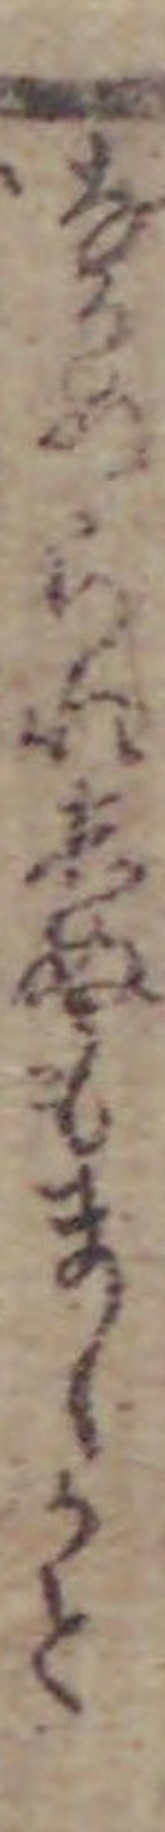なかめられしぬもましかと
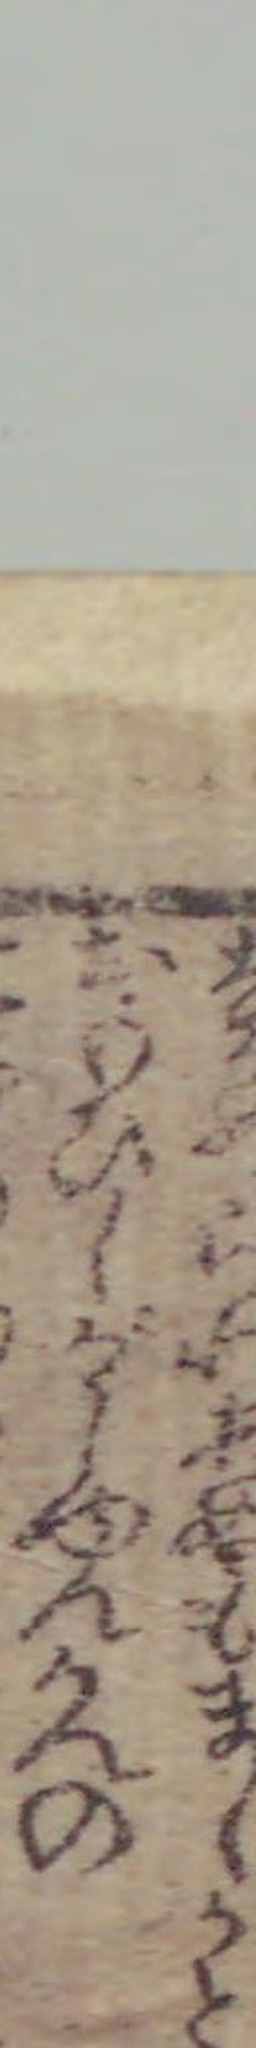おもひしがしゆんかんの
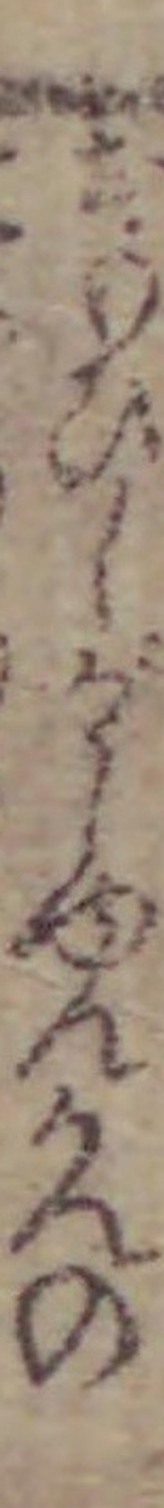おもひしがしゆんかんの
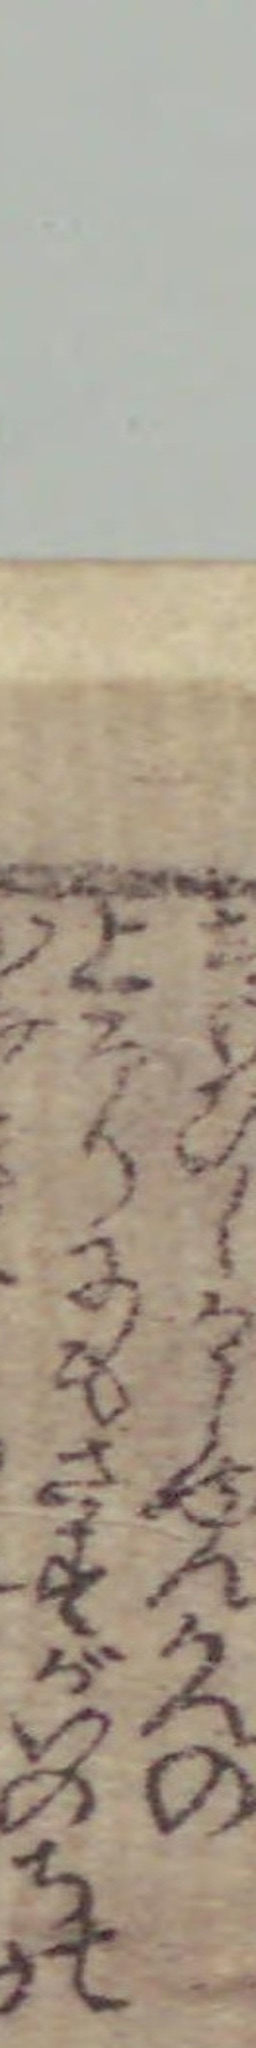上るりにもさすがいのちの
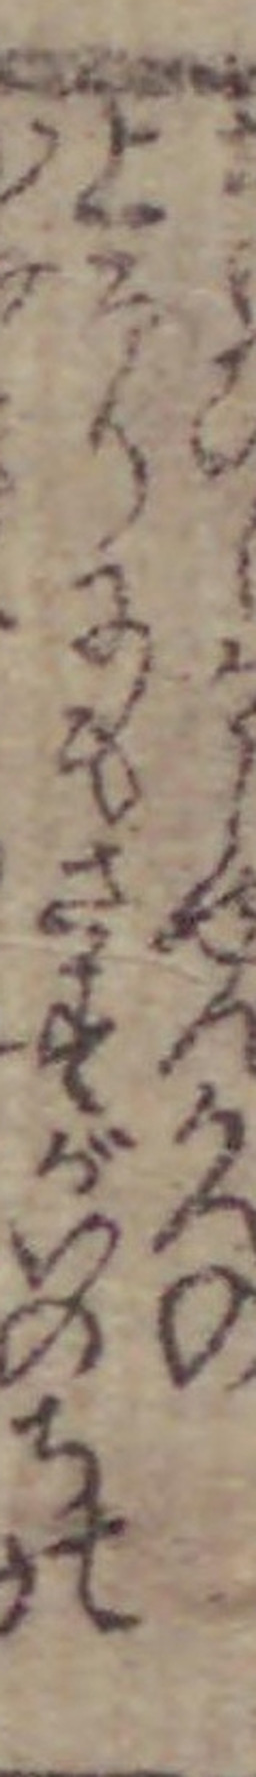上るりにもさすがいのちの
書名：御代の御寶
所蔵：国立国会図書館 National Diet Library, JAPAN
